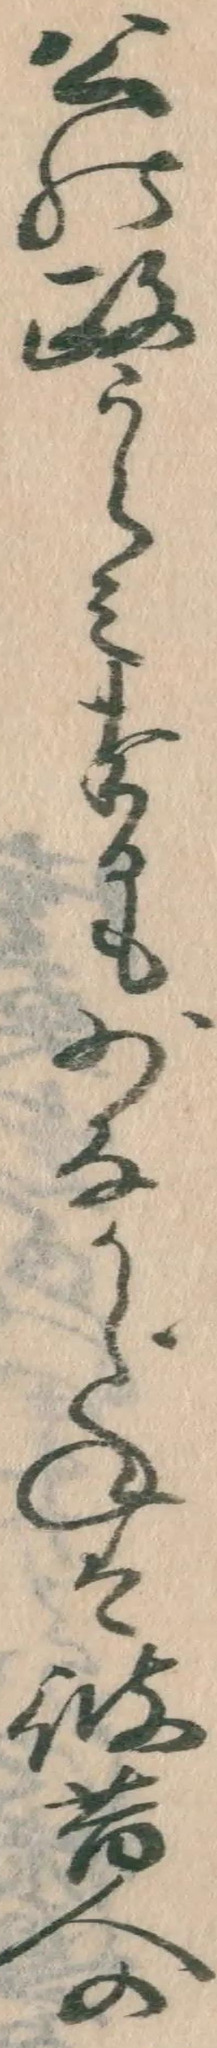公の政うらミ奉るも少なからねは彼昔人の
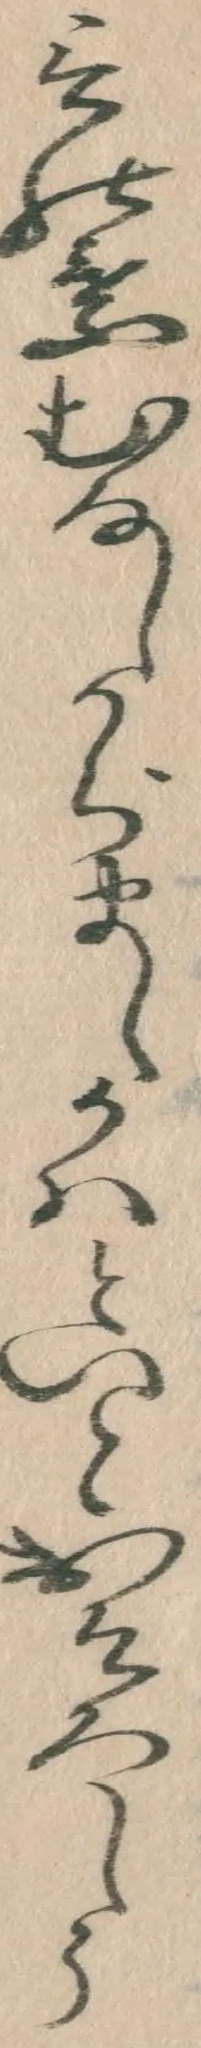云の葉むなしからましかハといとおそろしう
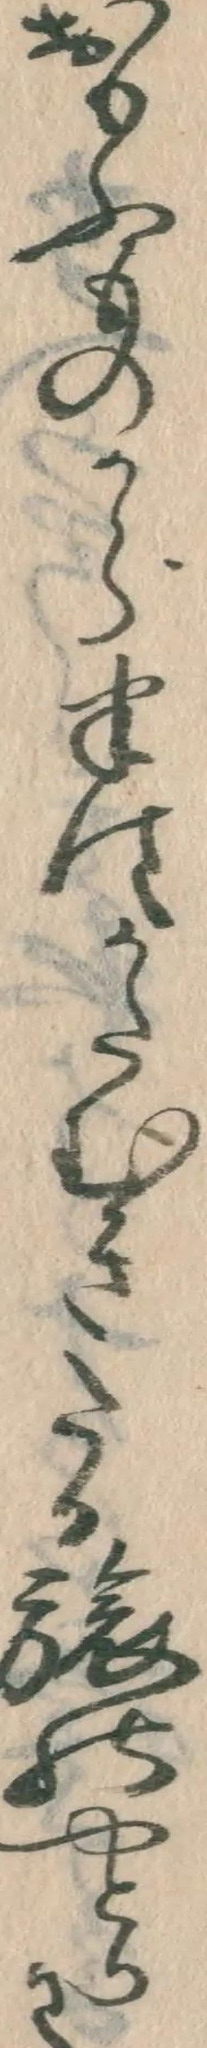おもふものから半はかたむきたる旅のやとりに
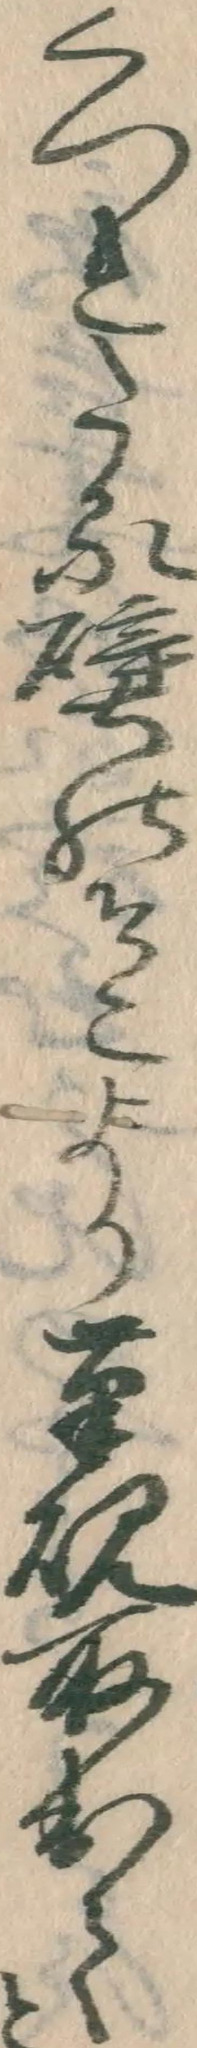くつれたる壁のそこより筆硯取出てと
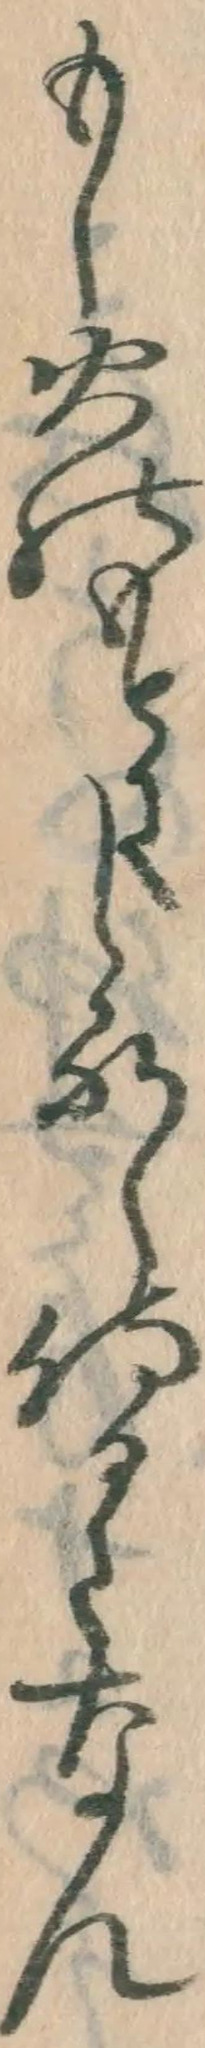もし火のもとにしるし侍るになん

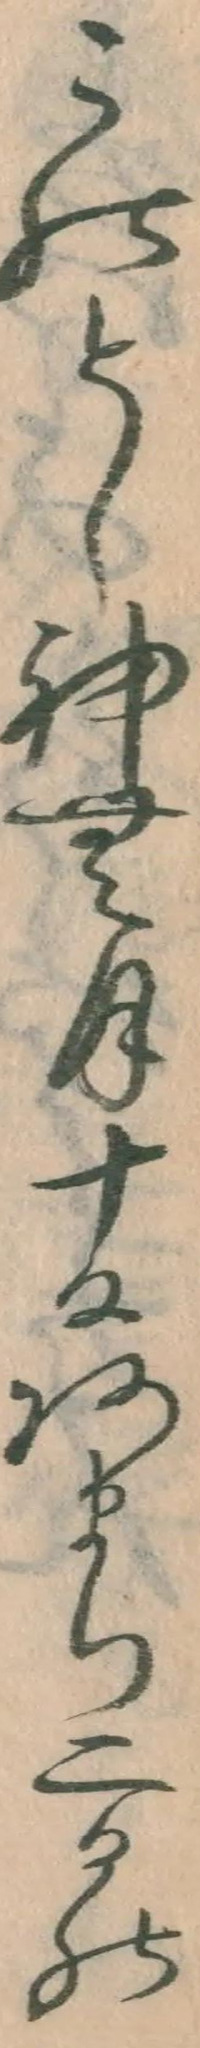このとし神無月十日あまり二日の
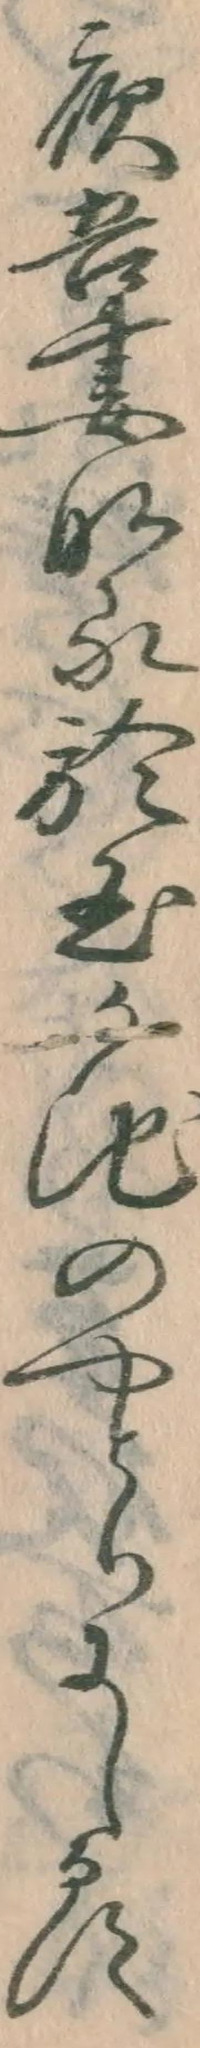夜吾妻なる於玉か池のやとりにしるす
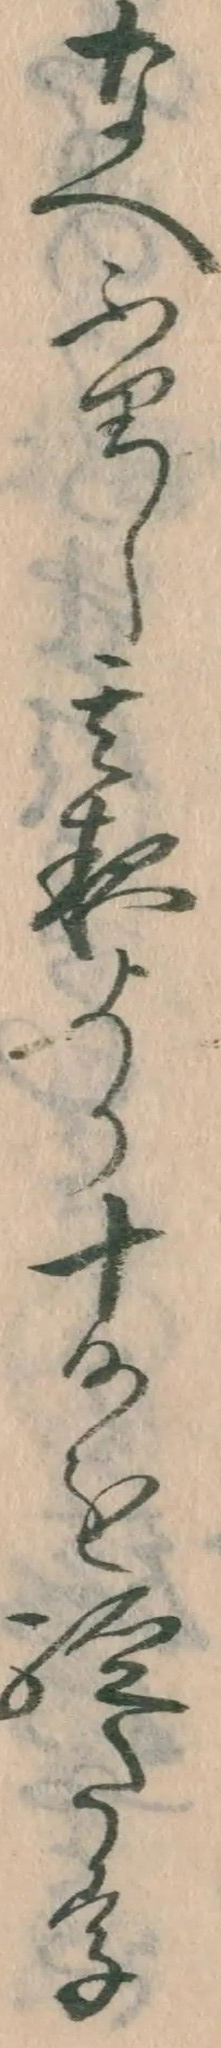なへふりし其夜より十日を経たり
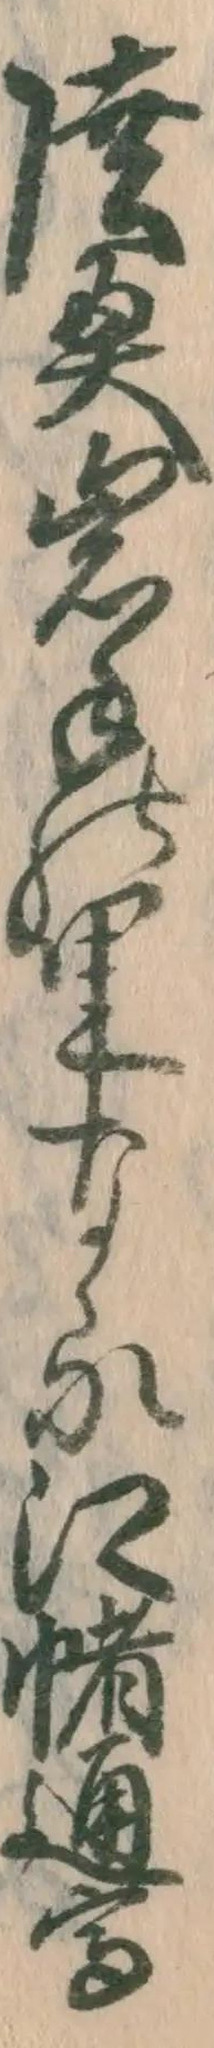陸奥岩手の里なる江幡通高

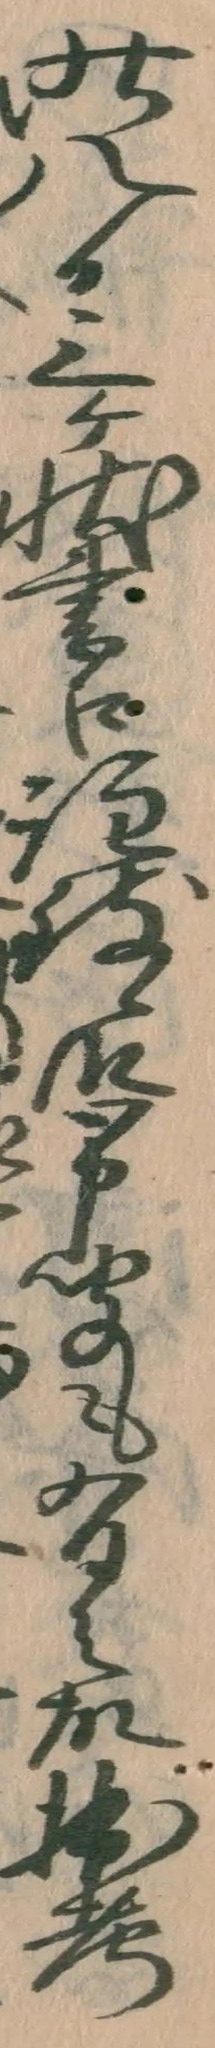昨八日三ヶ状書江注致候様御申聞も有之故拙考
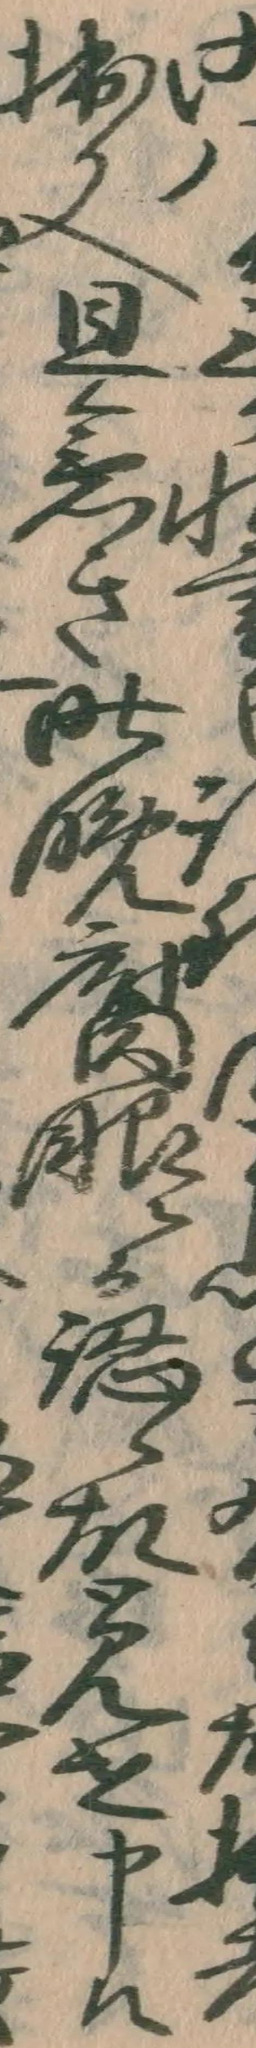拙文且急き昨晩腐眼ニ而認候故御見せ申候
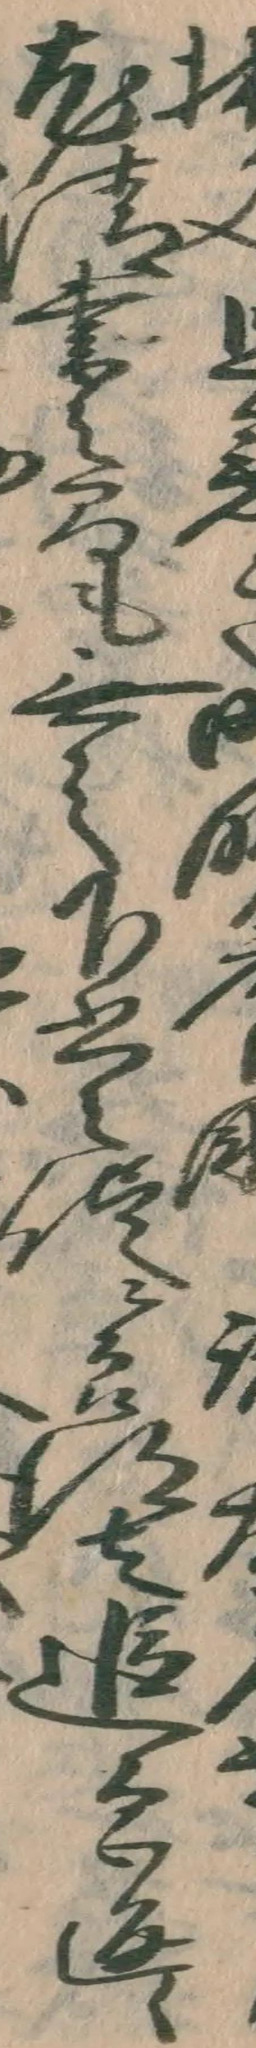尤清書之間も無之下書之儘ニ而候得者追而御返し
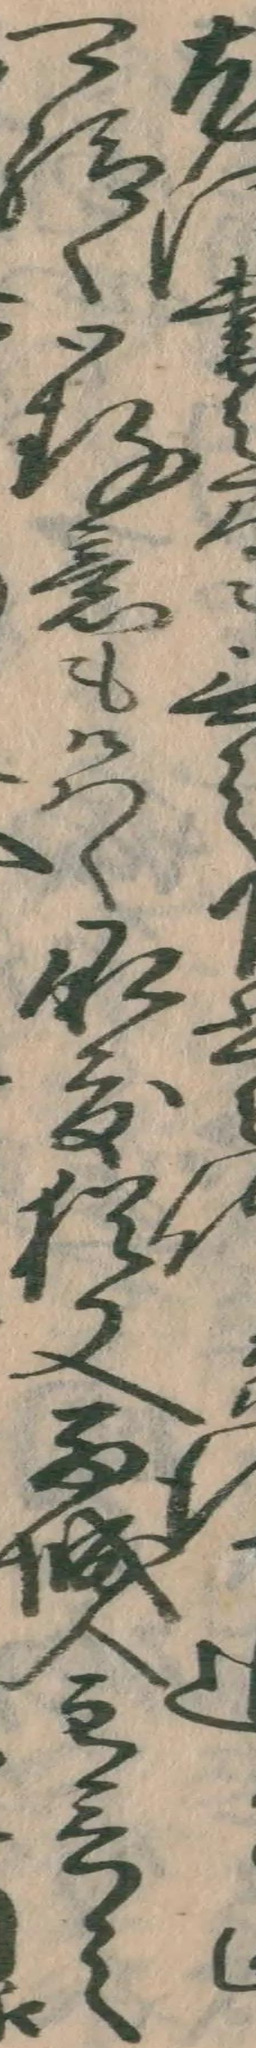可給く御存意も候ハヽ承度猶又両城全意之
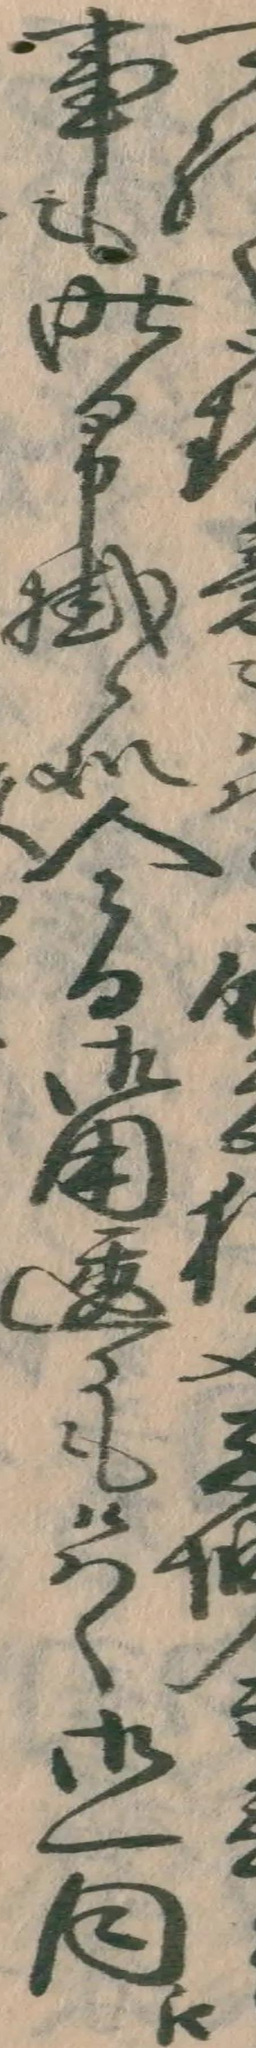事も昨日申掛候処今日御用透にも候ハヽ御一同江
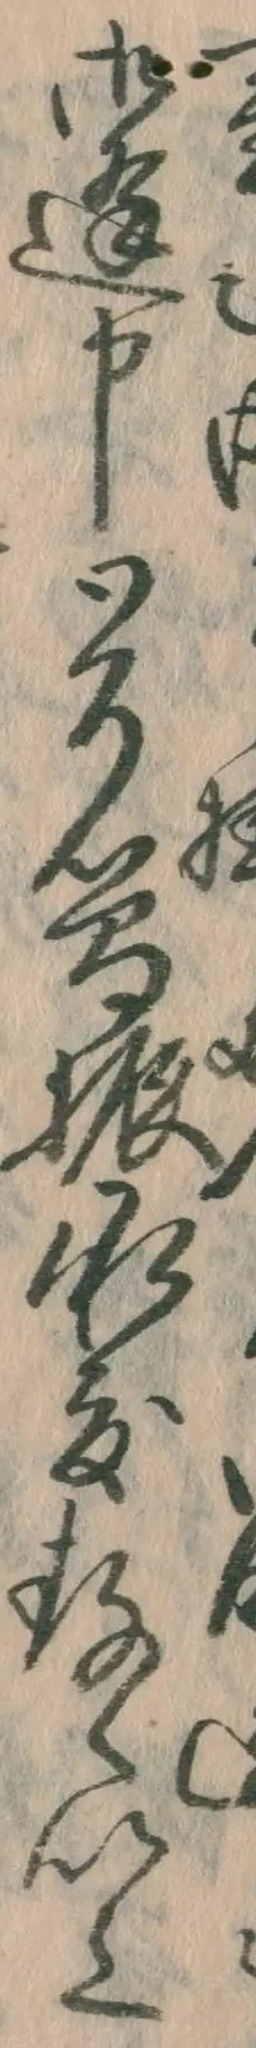御逢申御了簡振承度存候以上
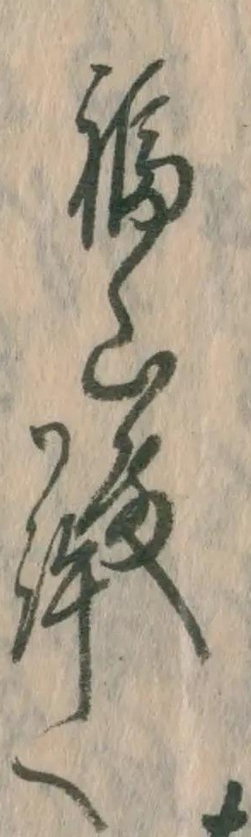福山殿
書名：麗斎叢書. 20
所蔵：国立国会図書館 National Diet Library, JAPAN
